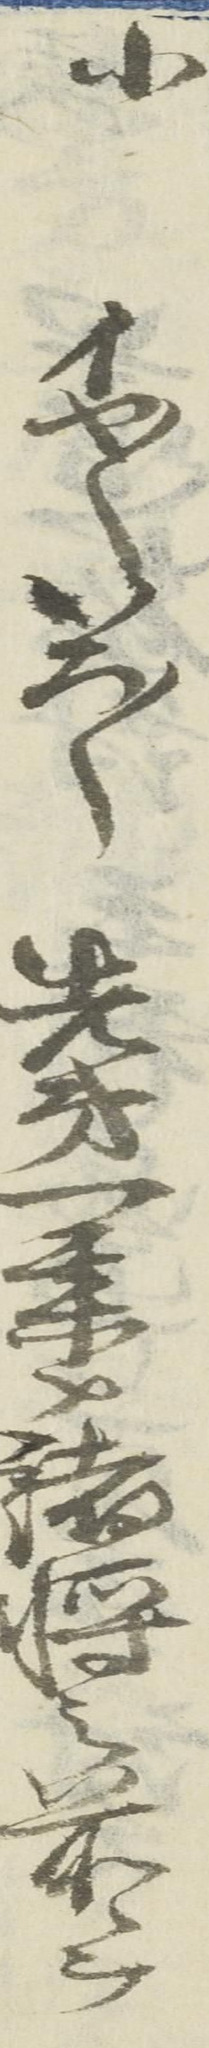小イヤ〳〵いろ〳〵先第一某ヲ諸将之前ニテ
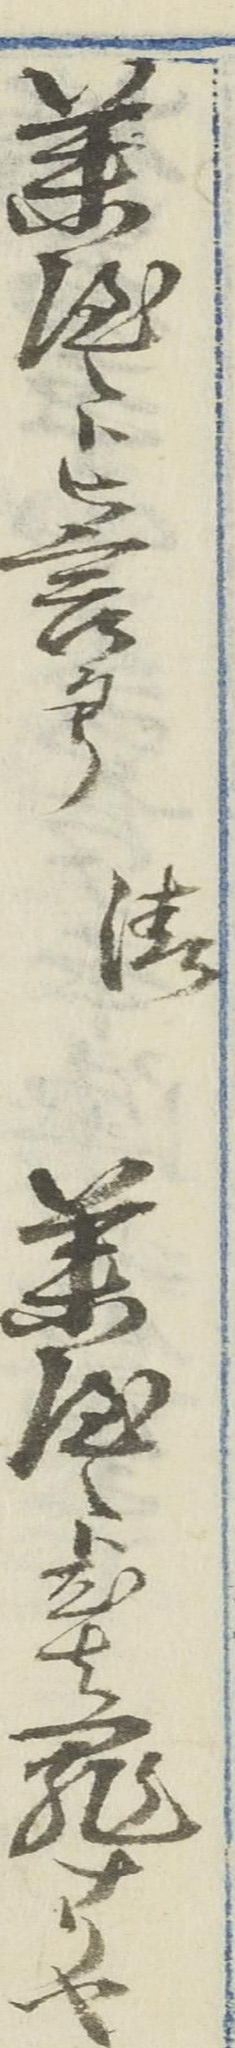薬屋ノト被言タリ清薬屋ニト云は罪ナリヤ
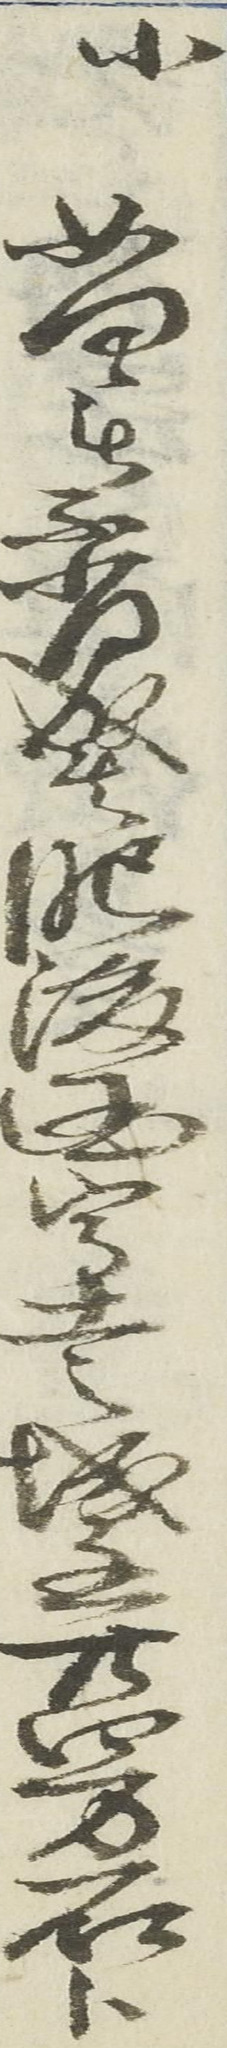小如何ニも不肖成共肥後国宇土之城主廿四万石ト
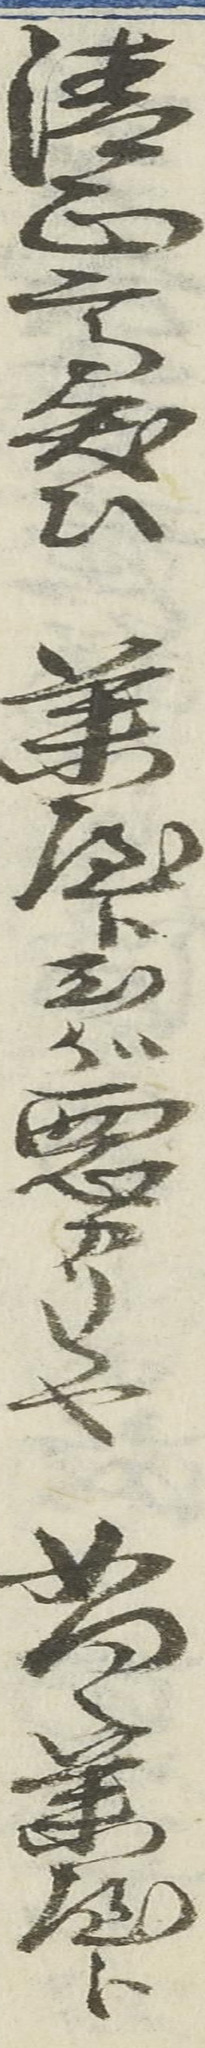清正高笑ひ薬屋ト云ガ悪カリしや如何之薬屋ト
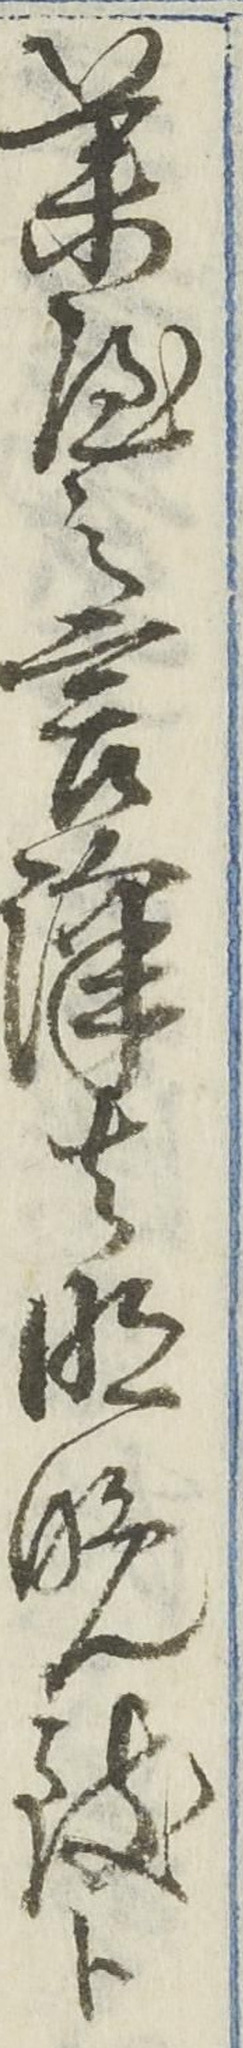薬屋之言訳は明晩致ト
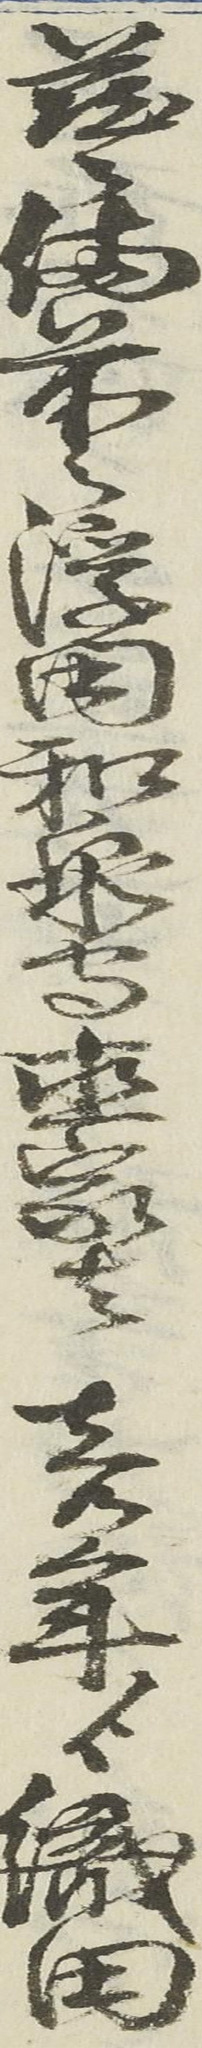茲ニ備前之浮田和泉守直家は去ル年ゟ織田
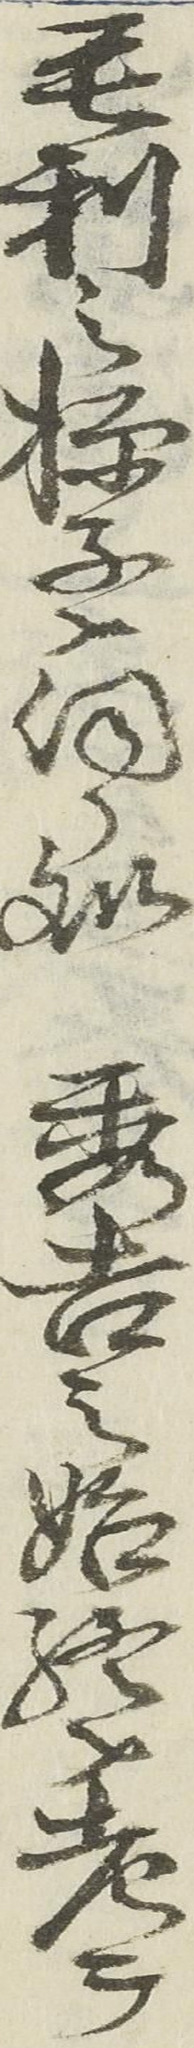毛利之様子ヲ伺う処秀吉之始終ヲ考テ
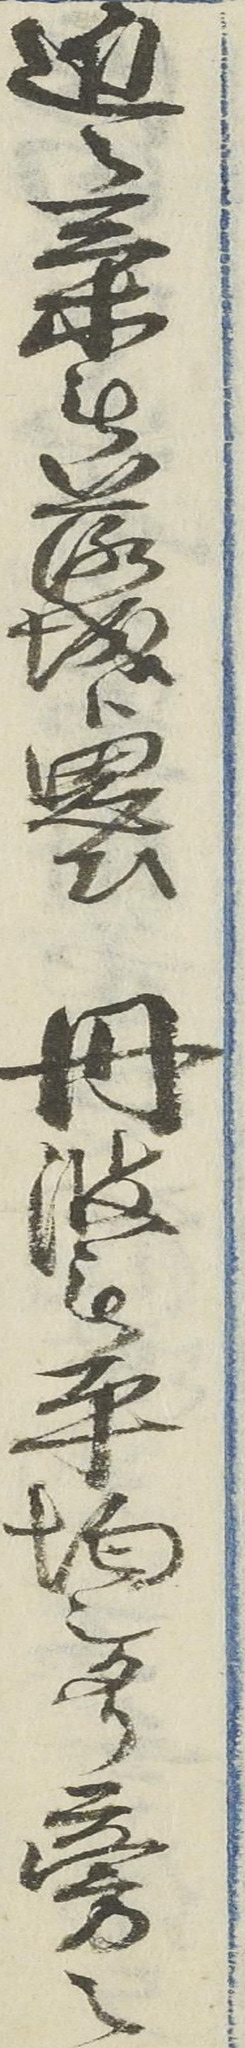近〻三木も落城ト思ひ丹波も平均シタリ旁之
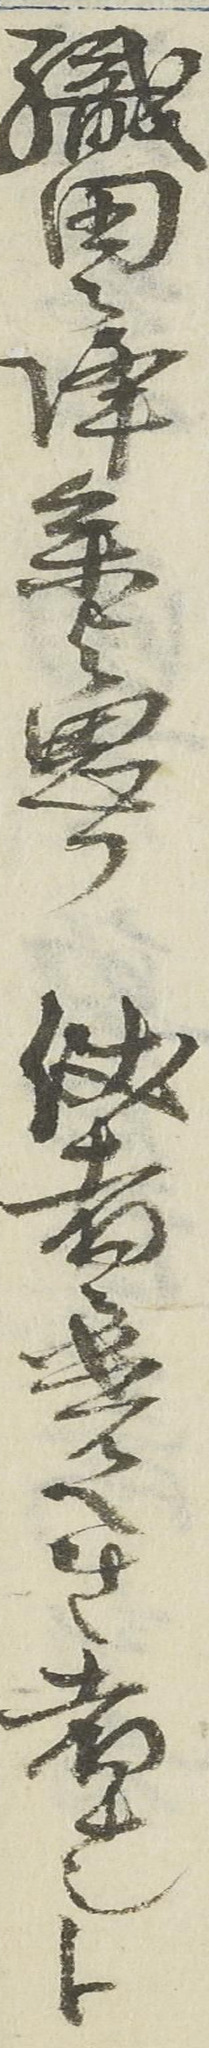織田之降参と思フ使者之遣ルへき者のナレト

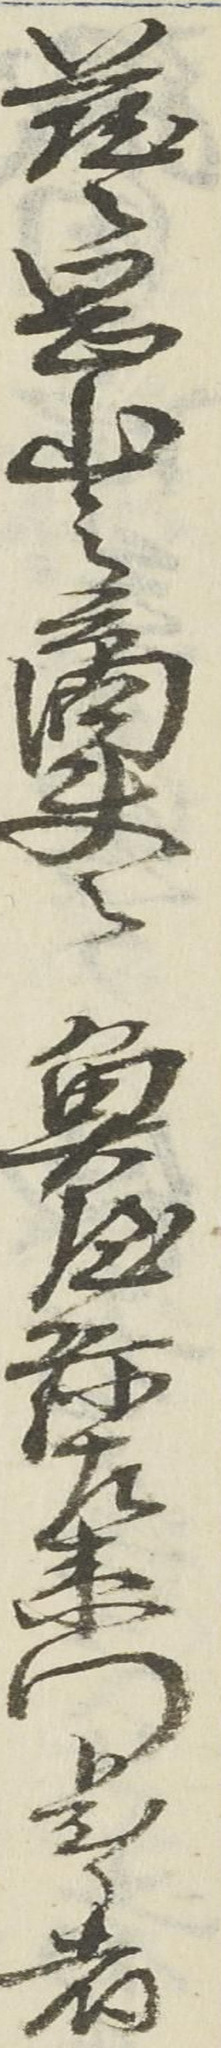茲ニ岡山之商夫ニ魚屋弥左衛門と云う者
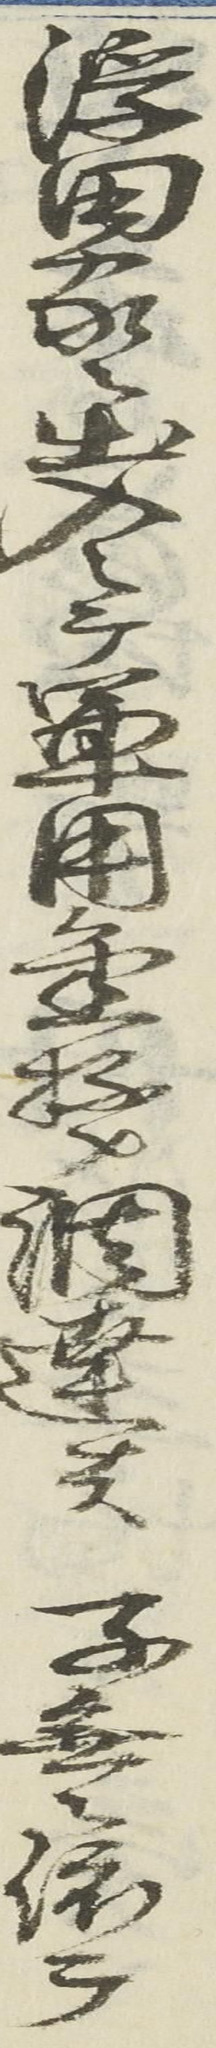浮田家ニ出入シテ軍用金抔ヲ調達ナス子無ニ依テ
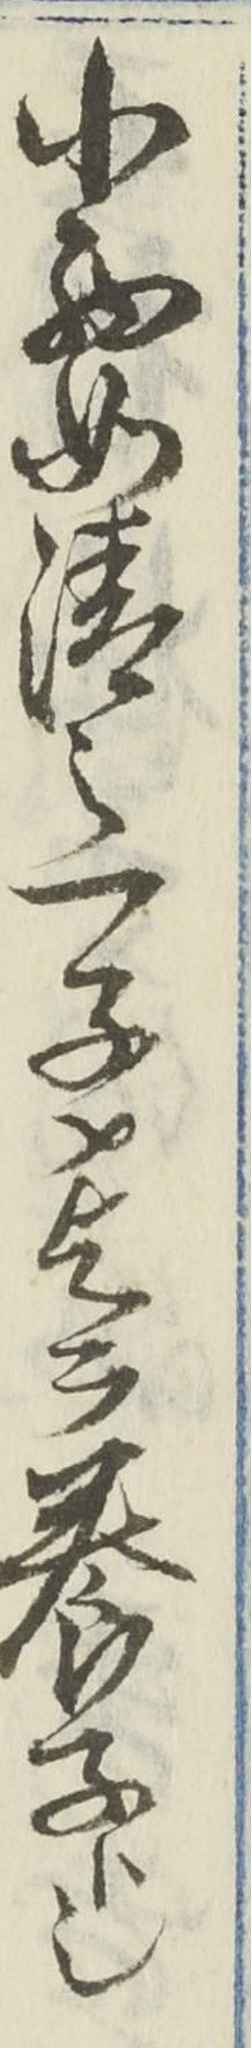小西如清之一子ヲ乞テ養子トシ
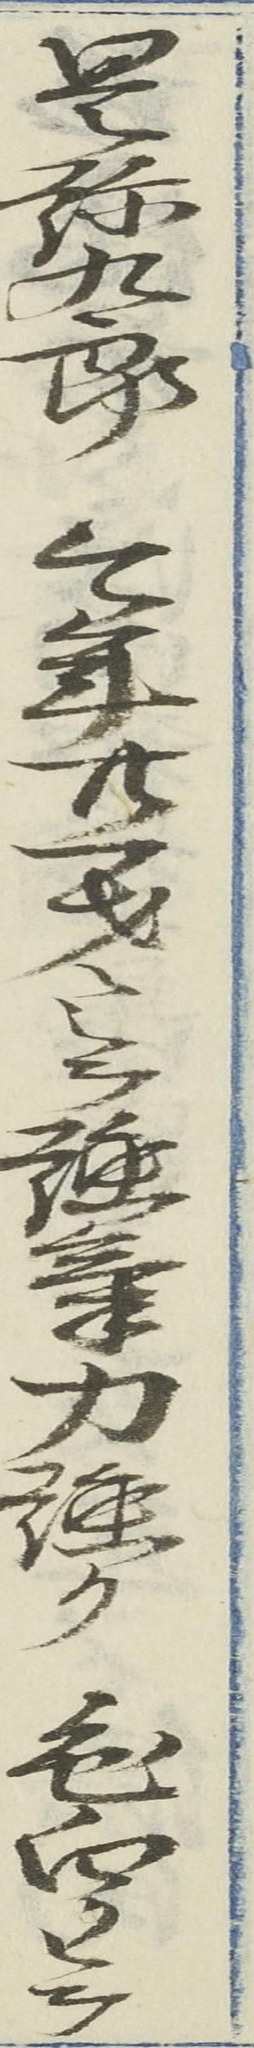是弥九郎今年廿一才ニシテ強気力強ク色白クシテ
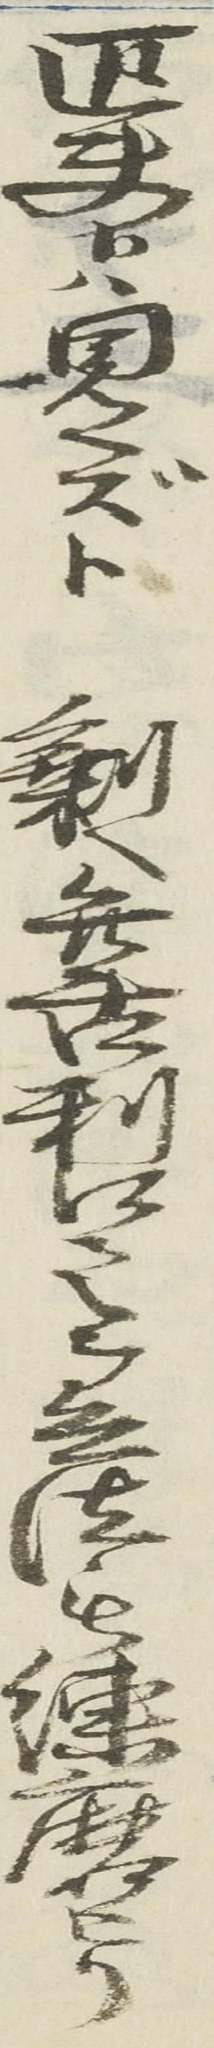匹夫トハ見ヘズト剰へ弁舌利口ニシテ兵法も練磨せり
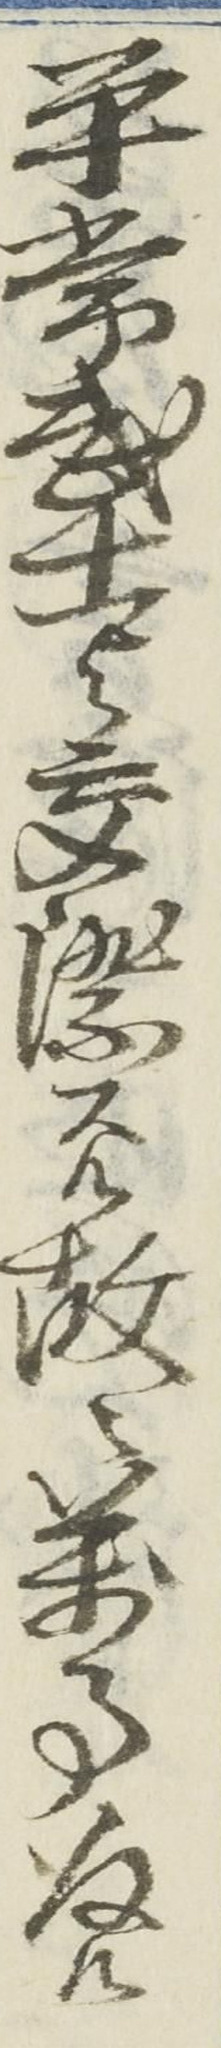平常武士と交際スル故万事存候
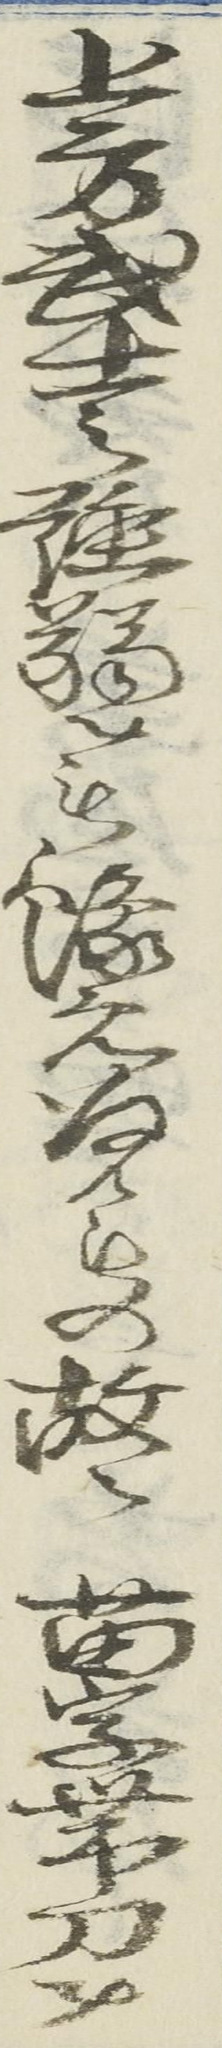上方武士之強弱ヲも豫め存候もの故ニ苗字帯刀ヲ
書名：伏水大地震
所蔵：東京大学地震研究所図書室 Earthquake Research Institute Library, The University of Tokyo, JAPAN
